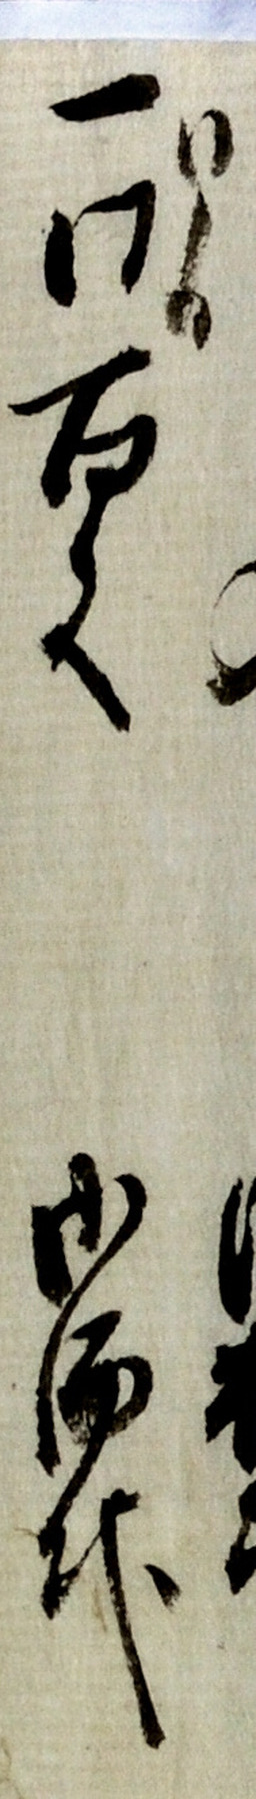一同百文御酒代

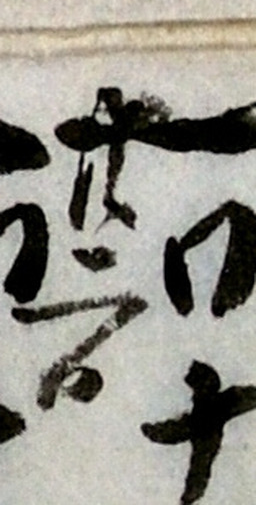廿二日
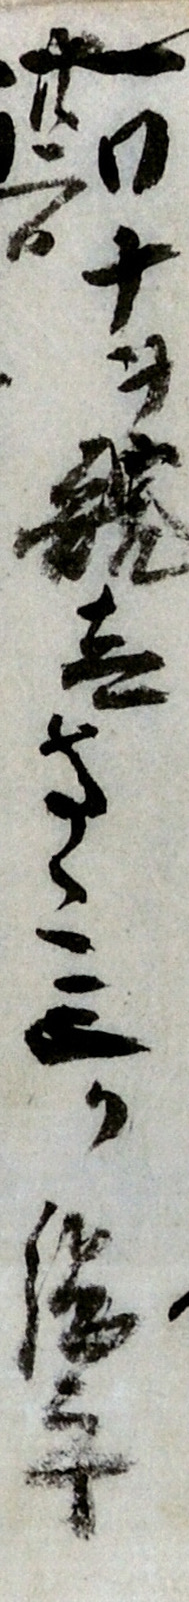一同十ヲ鯇壱さこ三ツ総平
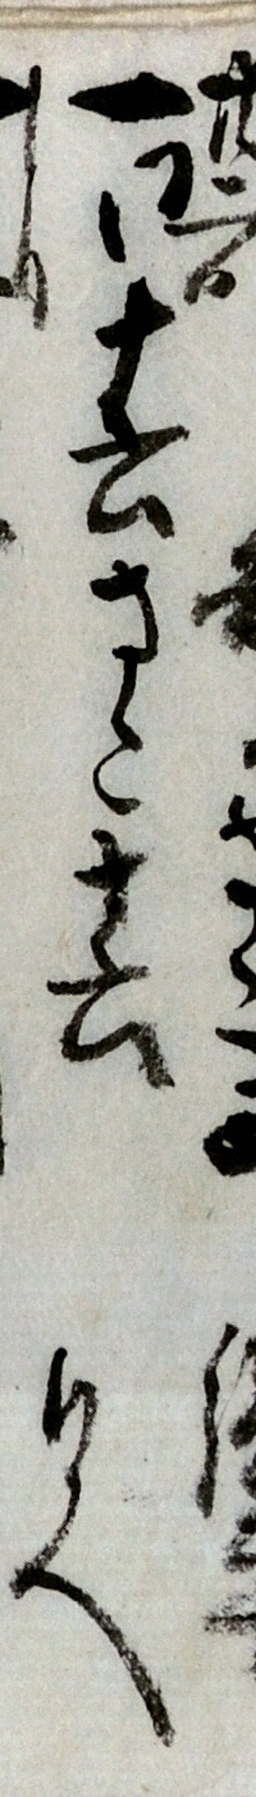一同十六さこ十六同人
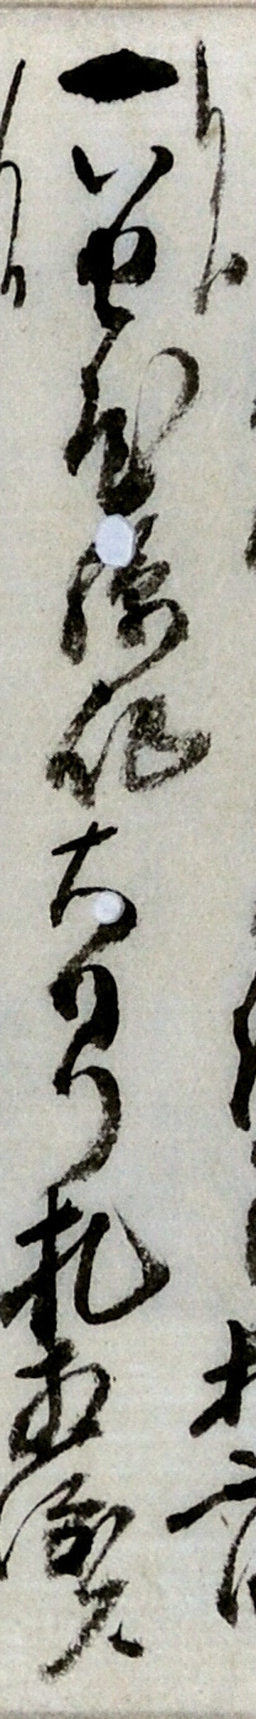一いせ屋源作右同断札相渡ス
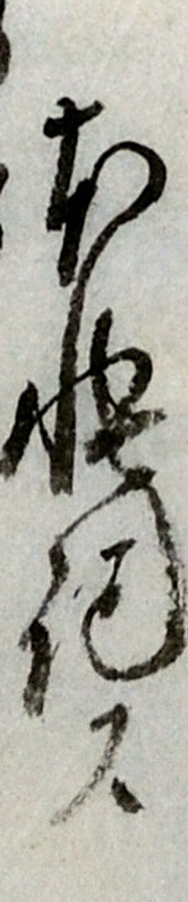本帳記ス
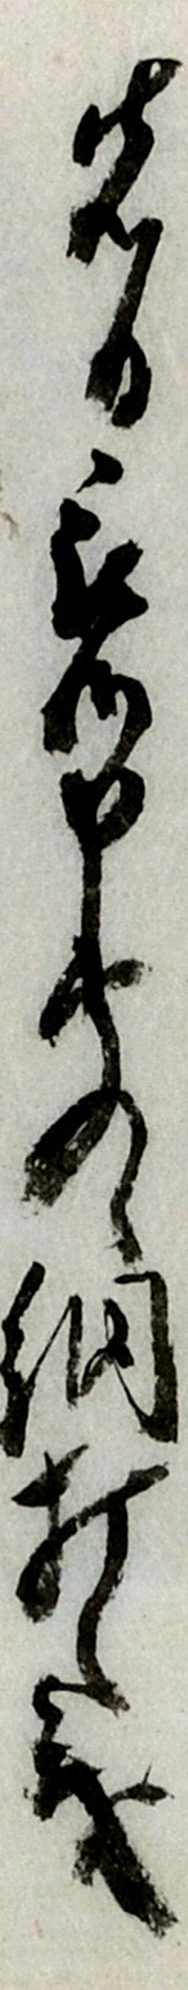先日被御申聞候網打之義
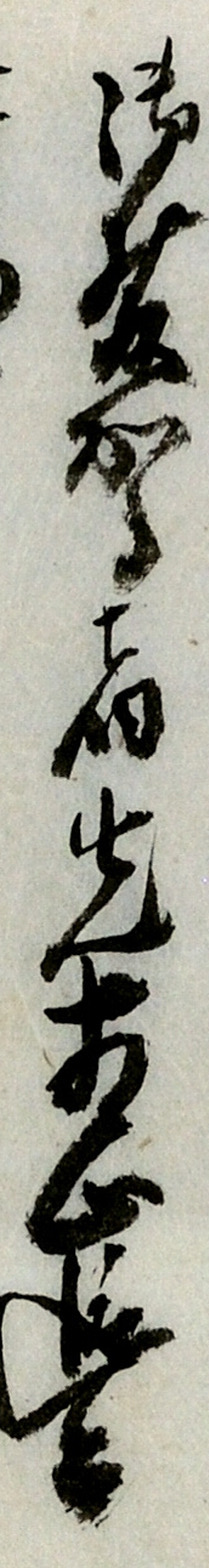御発駕宿先相止追て
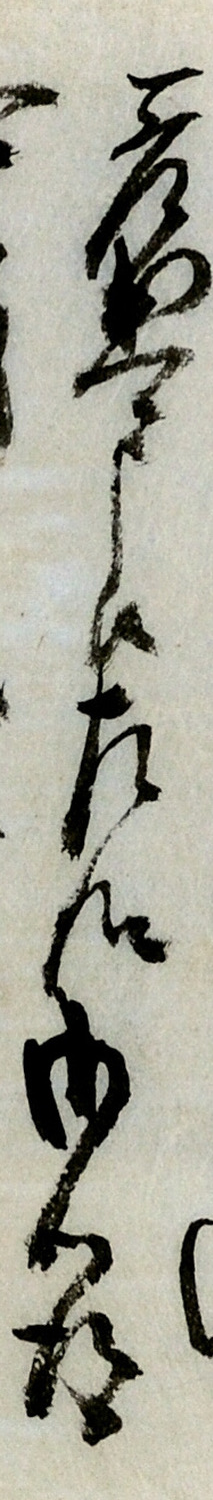差出可申候左様御心得
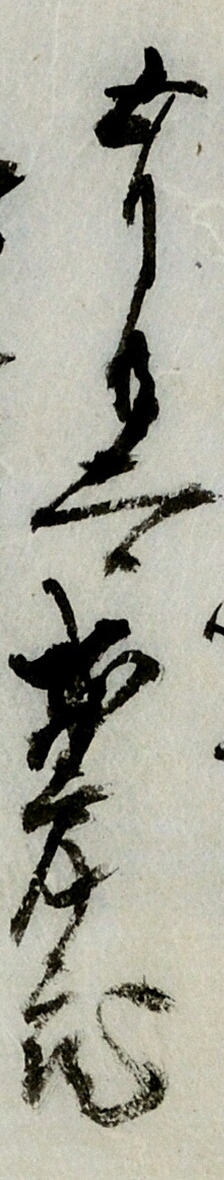五月十二日本庄屋
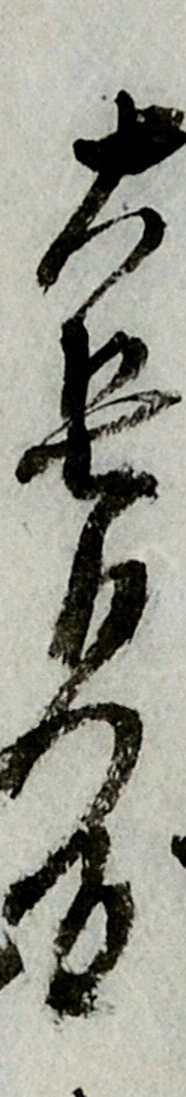大下七左衛門殿
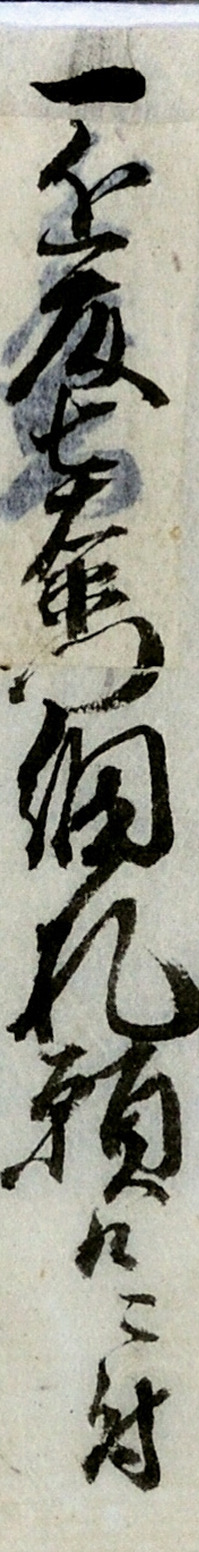一近藤七右衛門網札願候ニ付
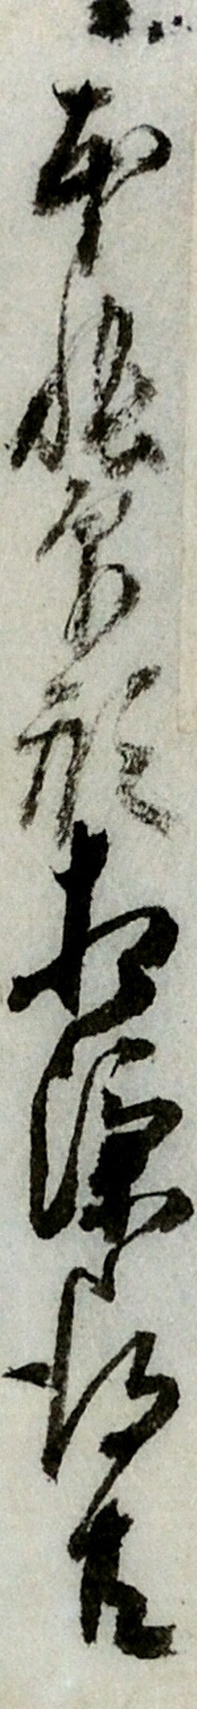本帳印形相済候得共
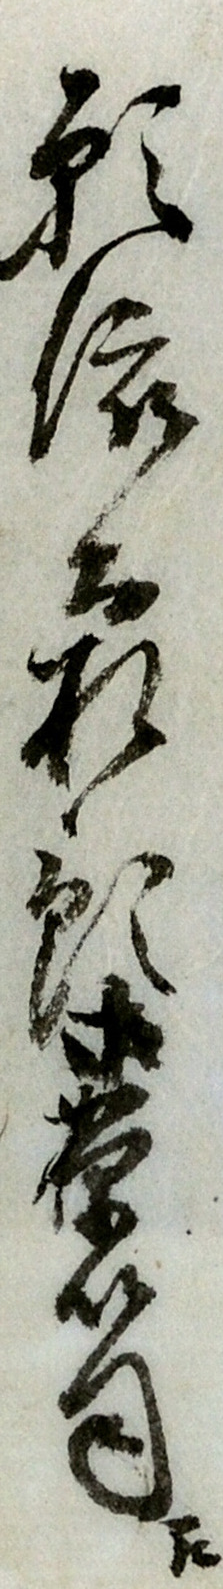願依而札預御箪笥え
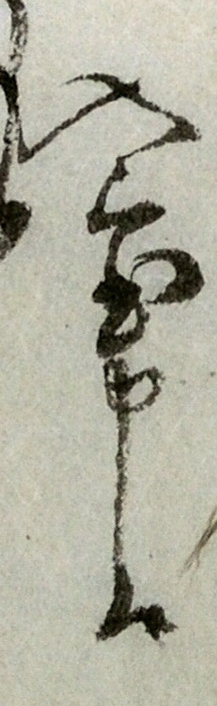入置申候
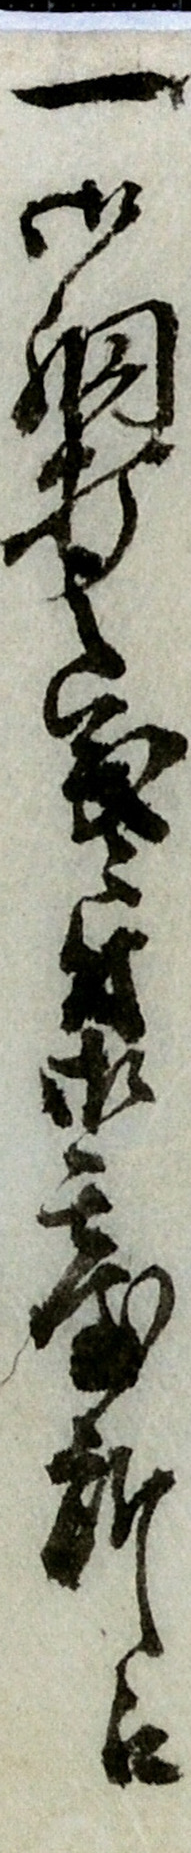一御網打之義に付御台所え
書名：分一方諸事御用留帳
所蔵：伊那市立高遠町図書館・合同会社AMANE
